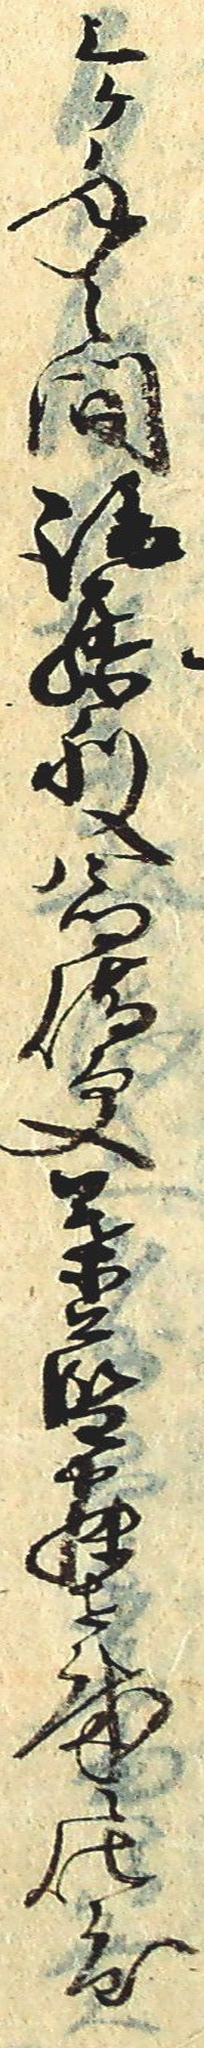三ヶ年之間後藤利八郎借受葉藍寐せ床に仕度
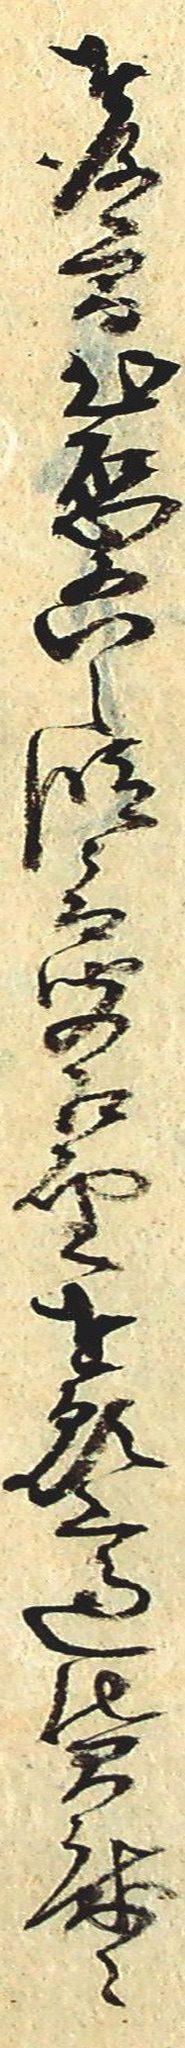奉存候間乍恐右之段被為聞召届奉願上通貸床に
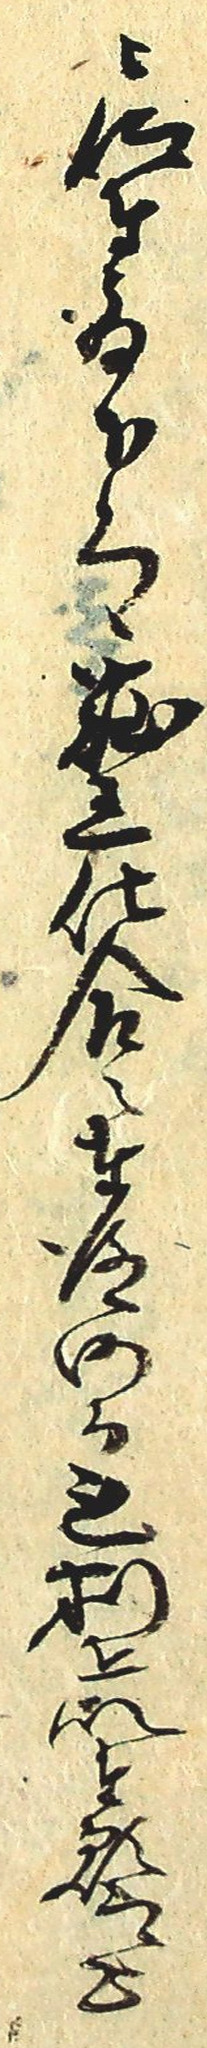被仰付被為下候はゝ難有仕合に奉存候仍て連判を以奉願上候以上
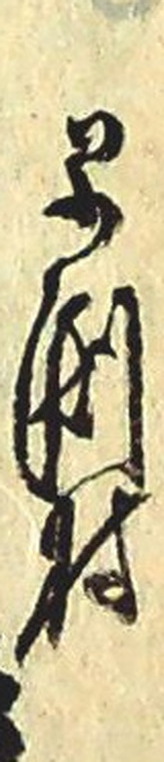早淵村
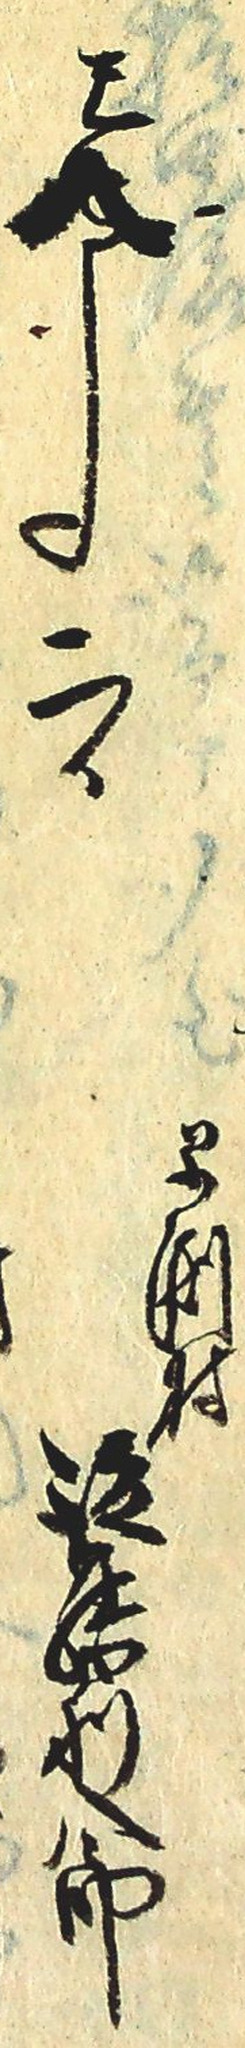巳八月二日後藤利八郎
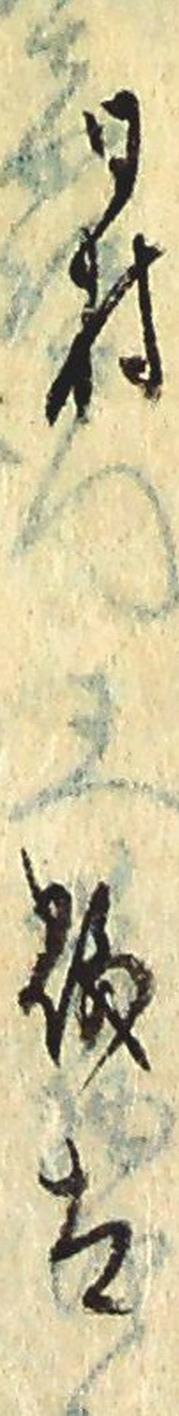同村磯太
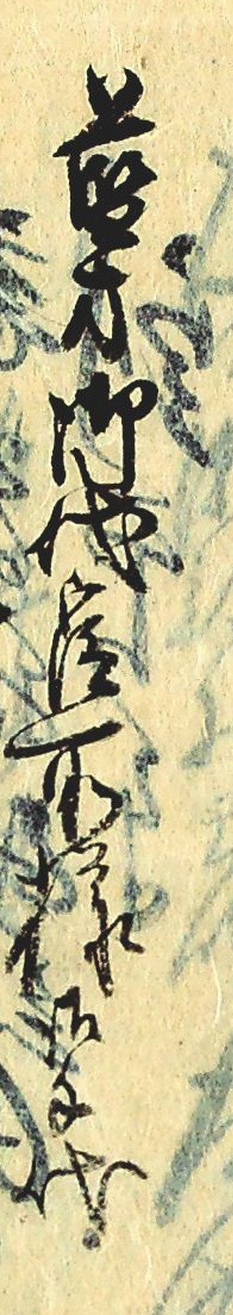藍方御代官所様御手代
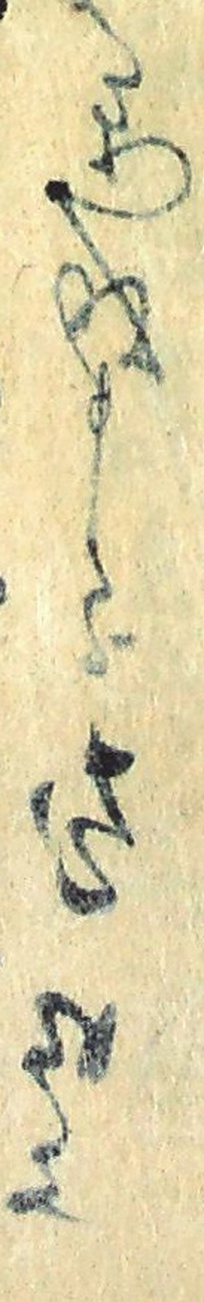早淵村庄屋
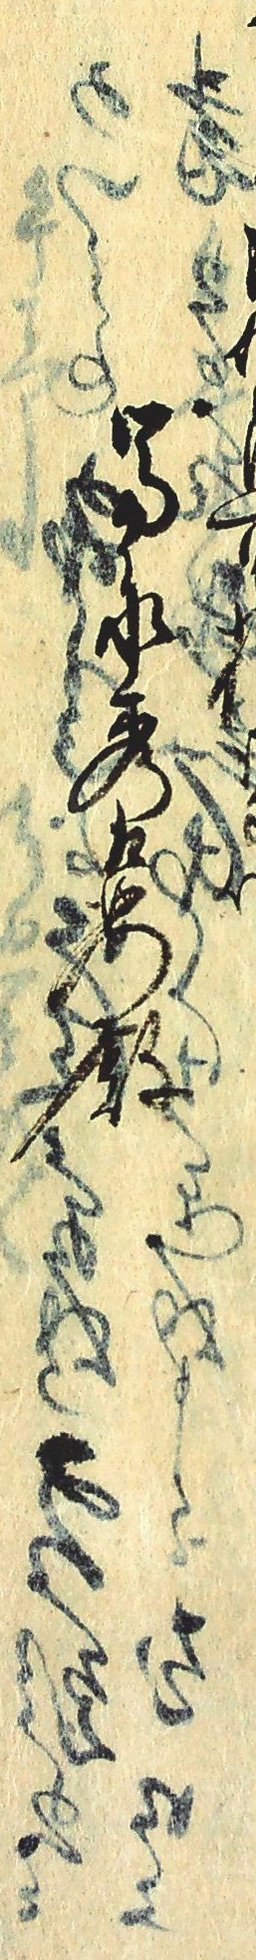富永秀左衛門殿
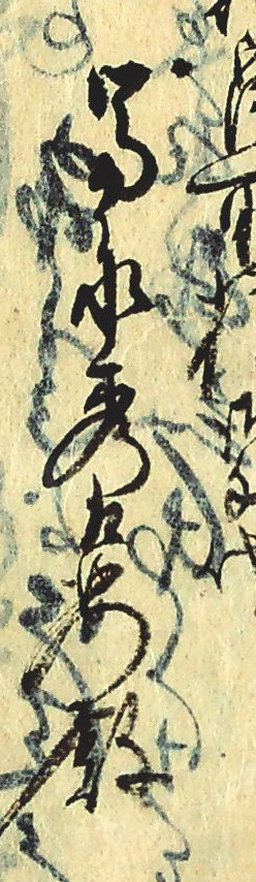富永秀左衛門殿
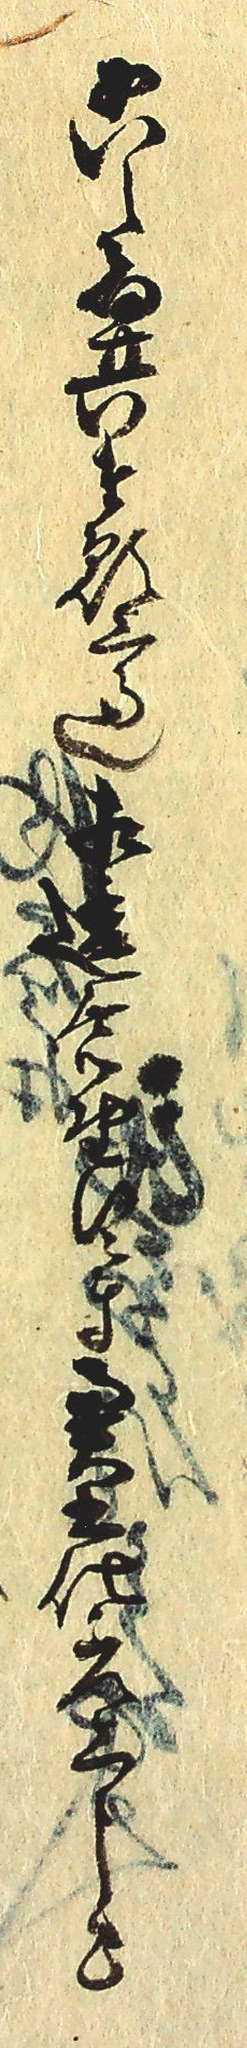右之者共奉願上通相違無御座候に付奥書仕差上申候以上
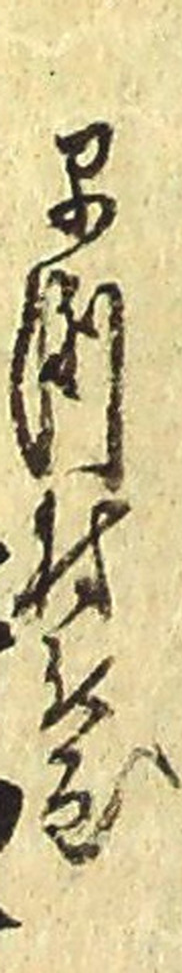早淵村庄屋
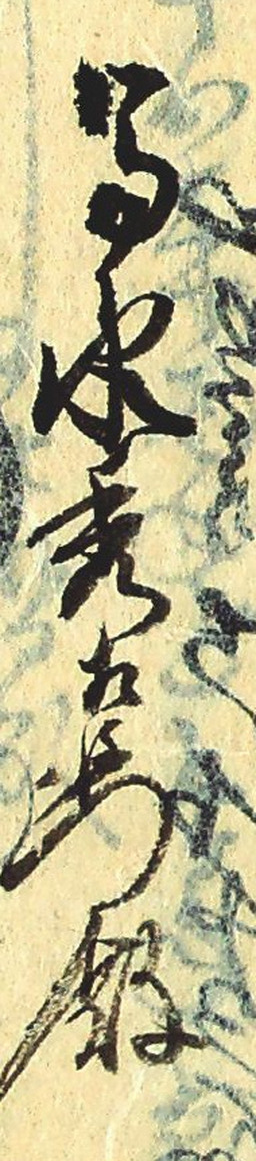富永秀左衛門殿

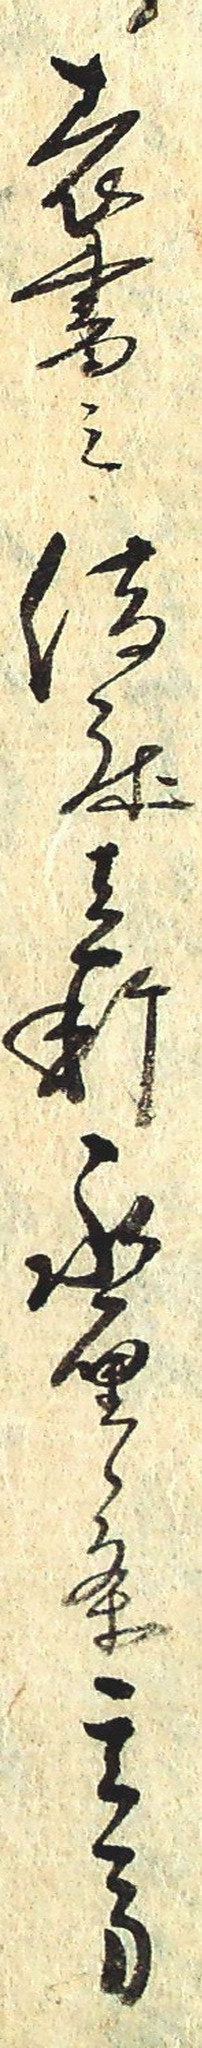表書之借床壱軒承届候条其方
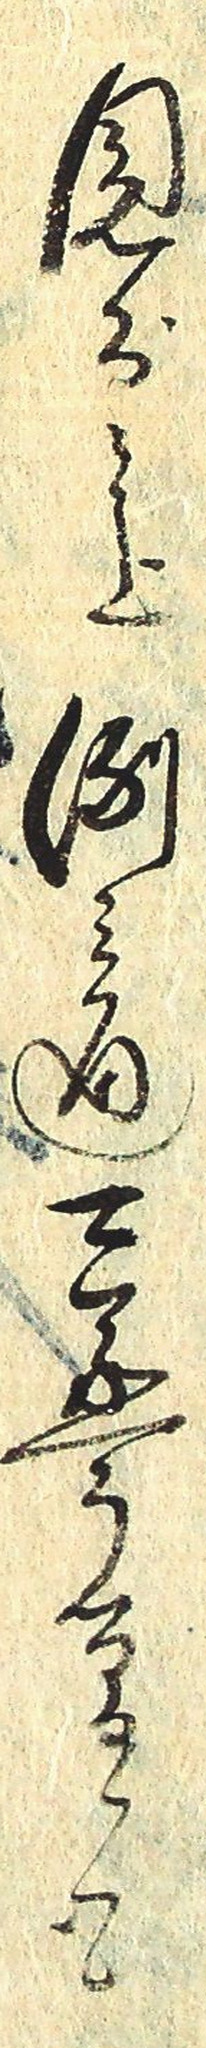見分之上例之通可遂了簡候以上
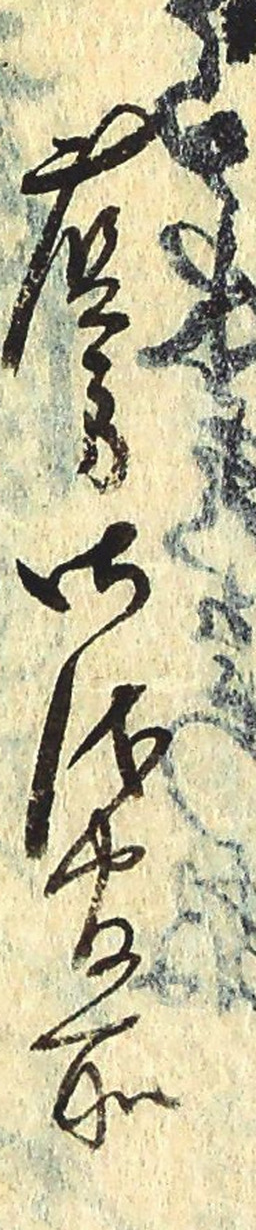藍方御代官所
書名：諸御願書控(弐番）
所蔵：鳴門教育大学 Naruto University of Education
